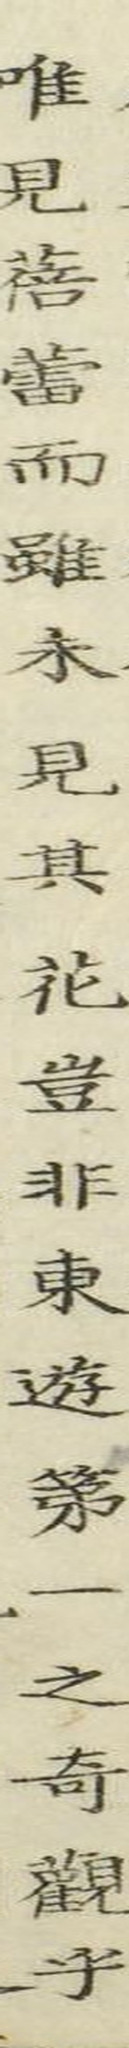唯見蓓蕾而雖未見其花豈非東遊第一之奇觀乎
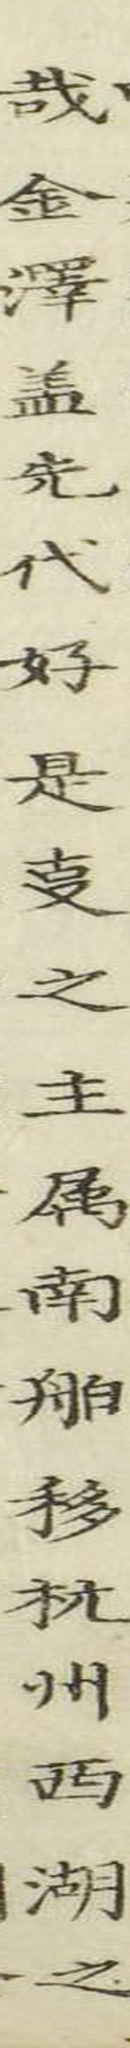哉金澤盖先代好是叓之主属南舶移杭州西湖之
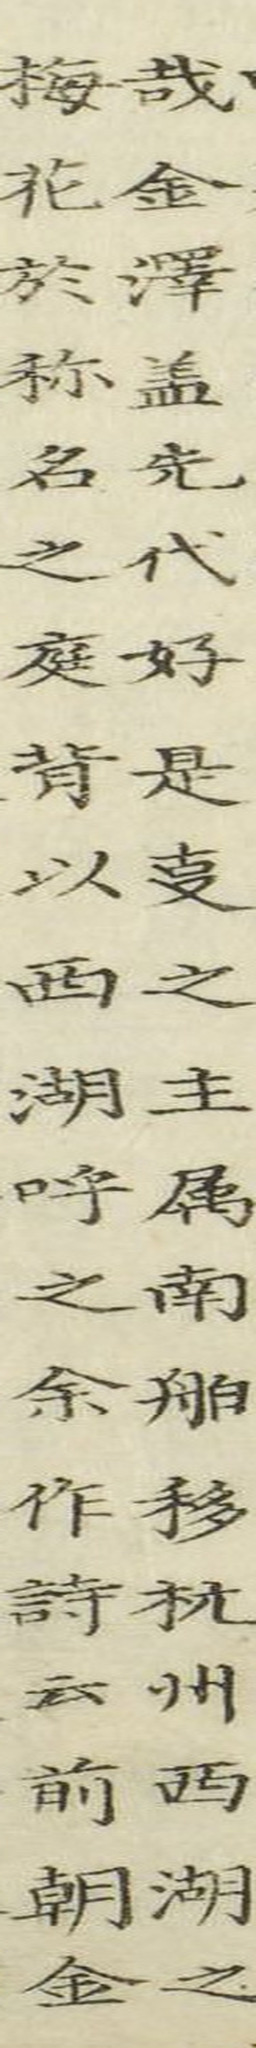梅花於称名之庭背以西湖呼之余作詩云前朝金
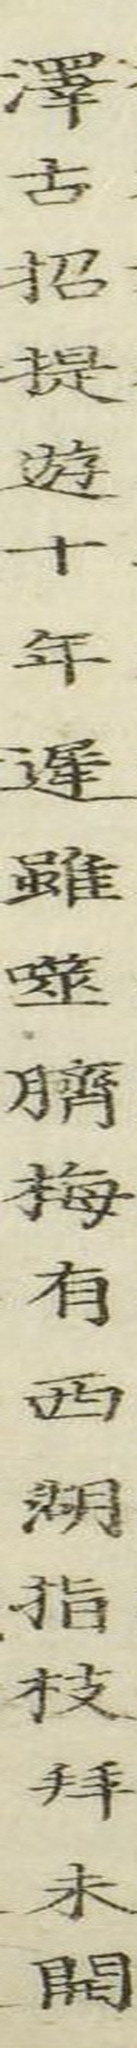澤古招提遊十年遅雖噬臍梅有西湖指枝拜未開
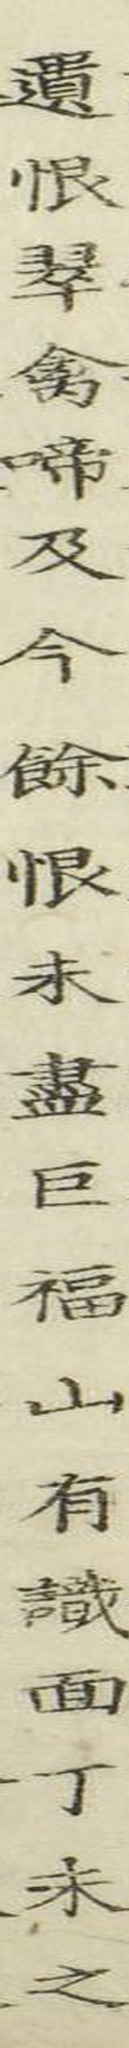遺恨翠禽啼及今餘恨未盡巨福山有職面丁未之
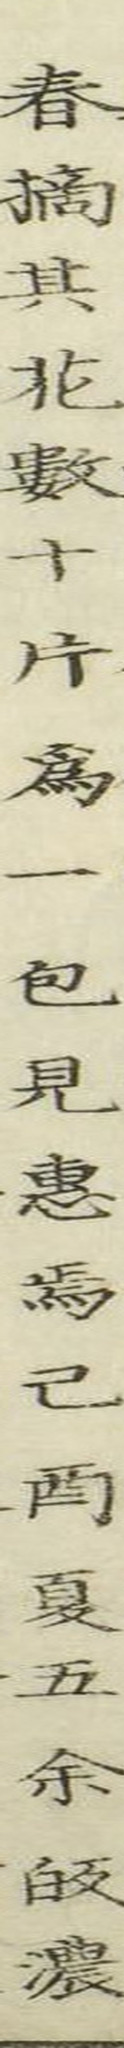春摘其花數十片爲一包見惠焉己酉夏五余皈濃
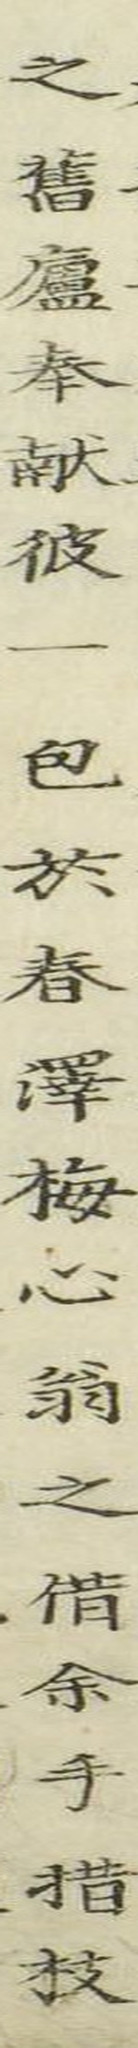之𦾔廬奉献彼一包於春澤梅心翁之借余手措枝
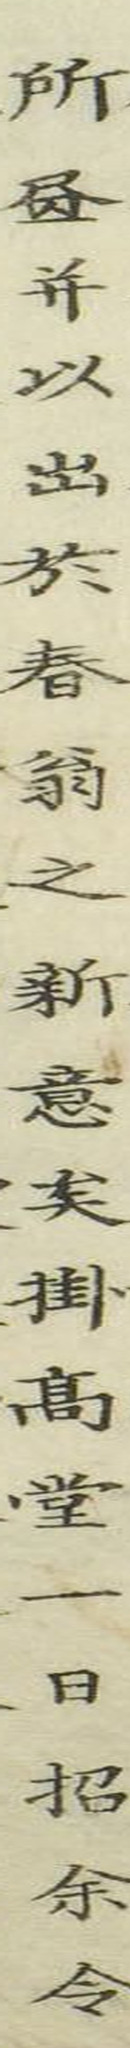所昼幷以出於春翁之新意矣掛髙堂一日招余令
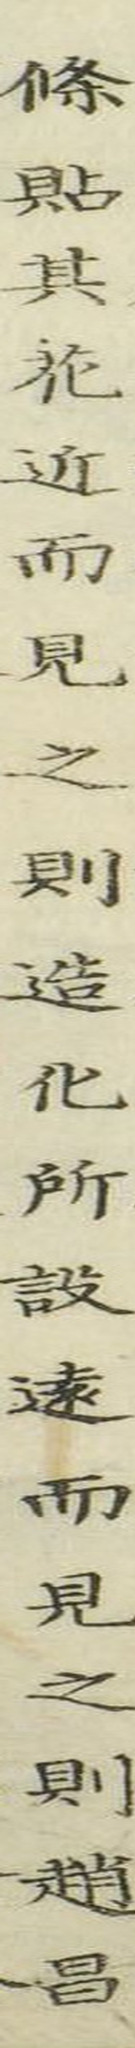條貼其花近而見之則造化所設遠而見之則趙昌
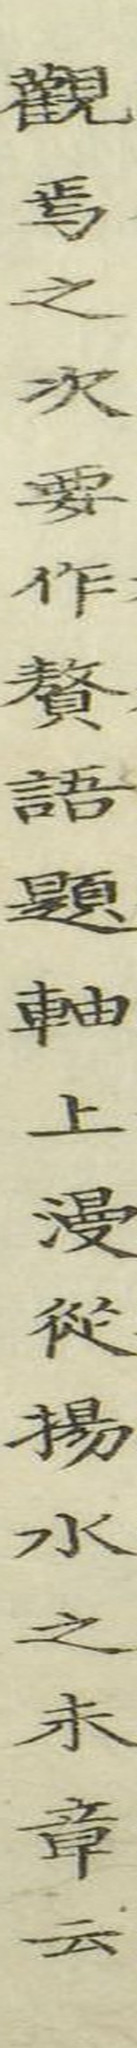觀焉之次要作贅語題軸上漫從揚水之未章云

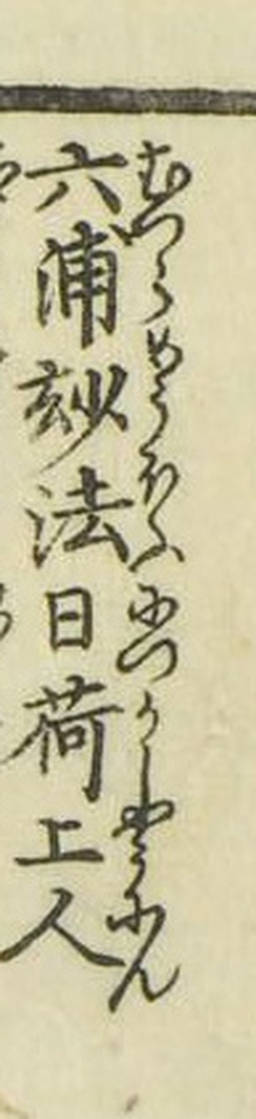六浦玅法日荷上人
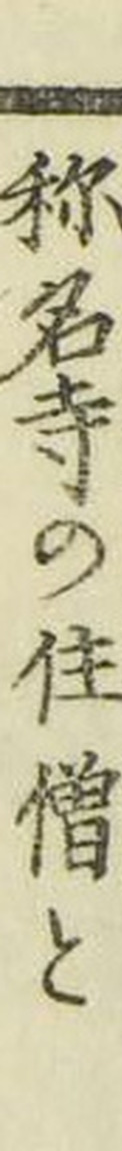称名寺の住僧と
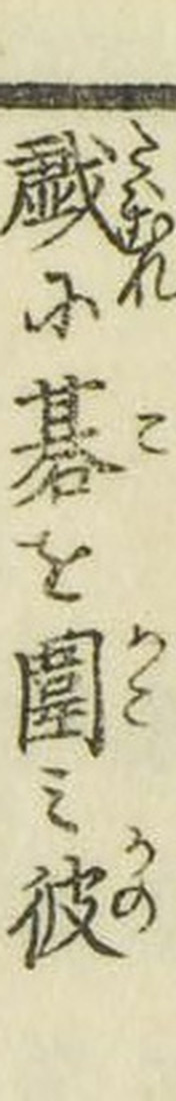戯に碁を圍み彼
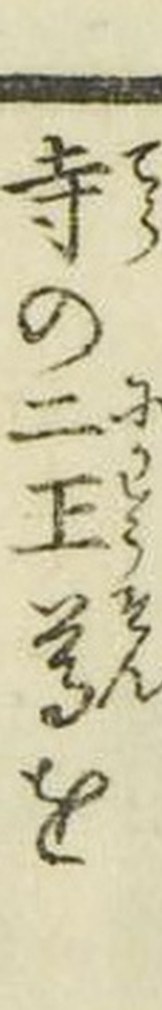寺の二王尊を
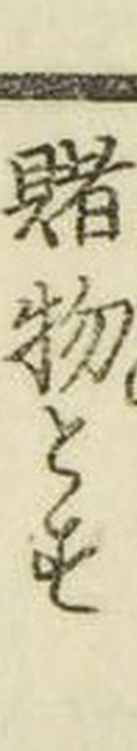賭物とす
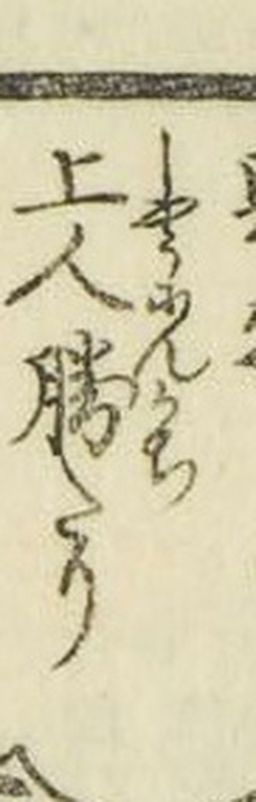上人勝たり
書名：江戸名所図会 20巻 巻之6
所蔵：東京学芸大学教育コンテンツアーカイブ
